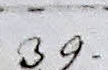39
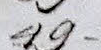49
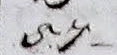57
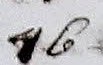46
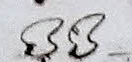33
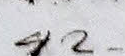42
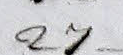27
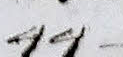44
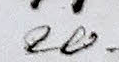20
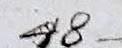48
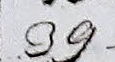39
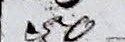50
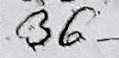36
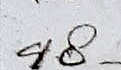48
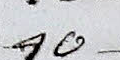40
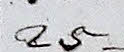25
